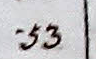53
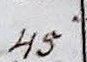45
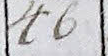46
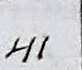41
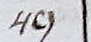49
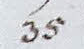35
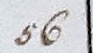56
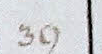39
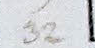32
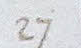27
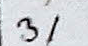31
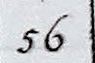56
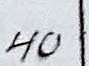40
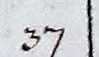37
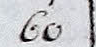60
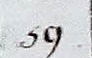59
